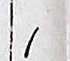1
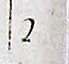2
